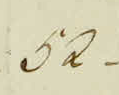52
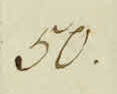50
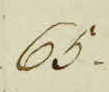65
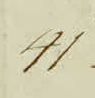41
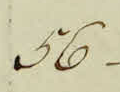56
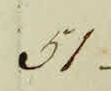51
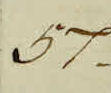57
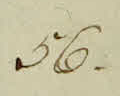56
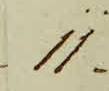11
